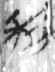利（利）
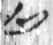㠯（以）
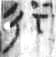行
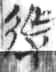{尸拃}（作）
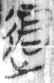○（蹠）
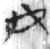四
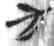方
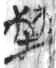埜（野）
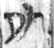外
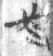必
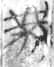無
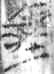堣（遇）
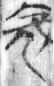○（寇）
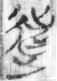逃（盜）
